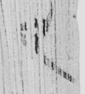也
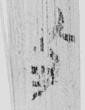此
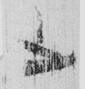之
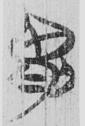{胃刀}（謂）
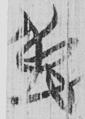○（仁）
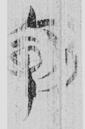○（宰）
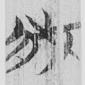我
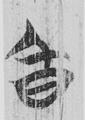昏（問）
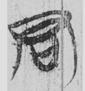君
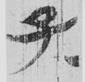子
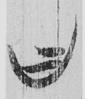曰
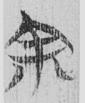余（予）
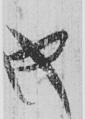女（汝）
